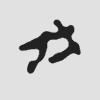伐
